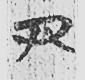四
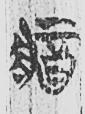𨟻
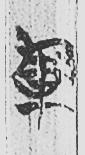軍
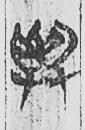與
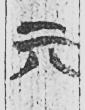亓
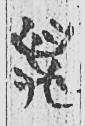萬
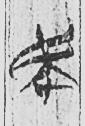民
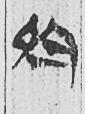於
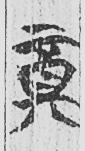奠
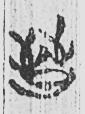晉
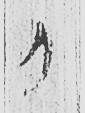人
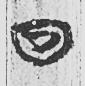回
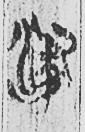{水？}
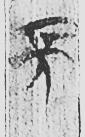長
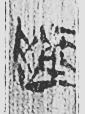陵
